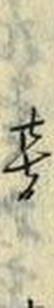廿九日
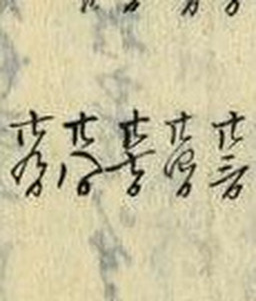廿九日
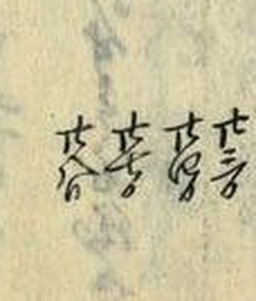廿九日
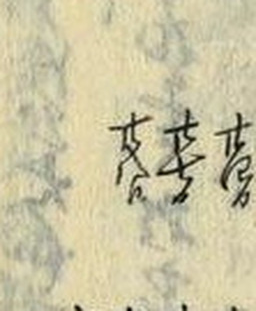廿九日
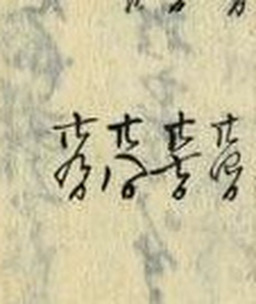廿九日
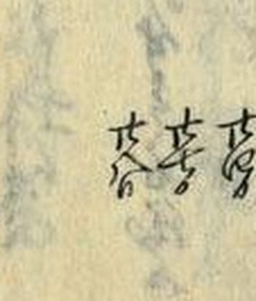廿九日
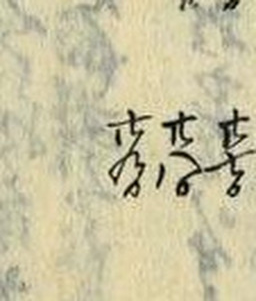廿九日
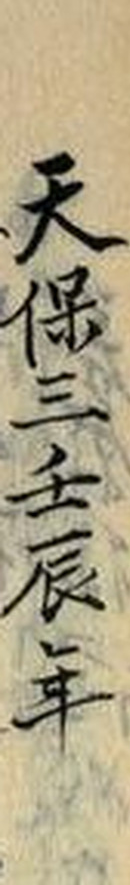天保三壬辰年
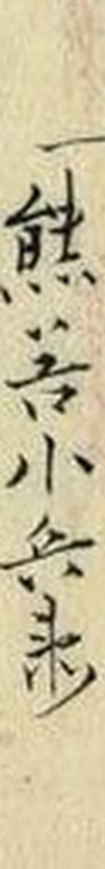熊谷小兵衛
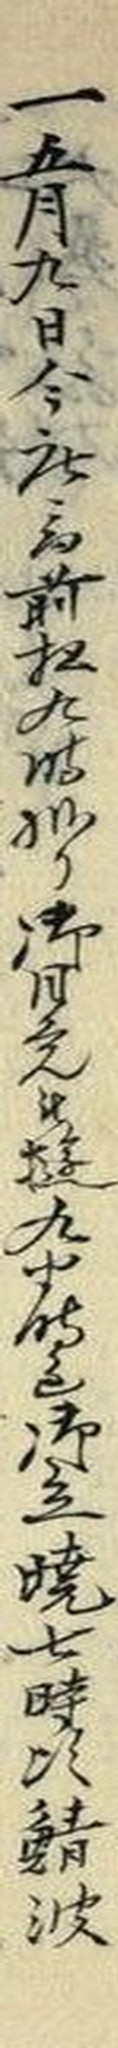一五月九日今庄ニ而前夜九時掛り御目覚被遊九半時過御立暁七時頃鯖波
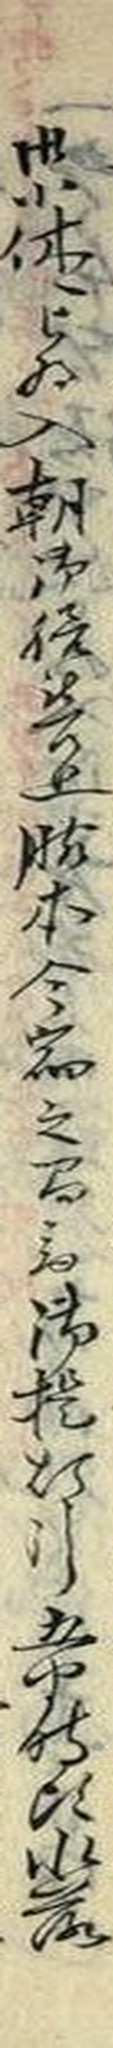御小休へ被為入朝御膳被召上脇本今宿之間ニ而御提灯引五半時頃水落
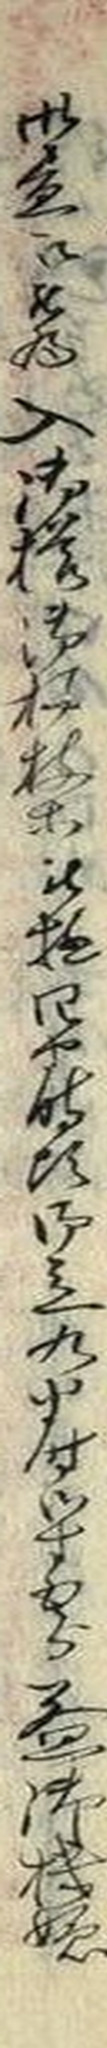御昼江被為入御櫛御楊枝等被遊四半時頃御立九半時弐寸五分益御機嫌
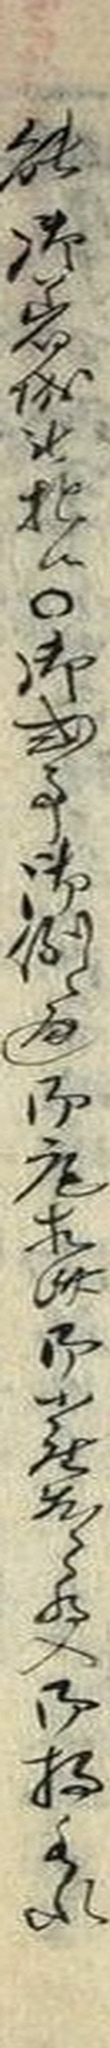能御着城被遊候〇御式事御例之通御庭相済御小座敷へ被為入御持手水
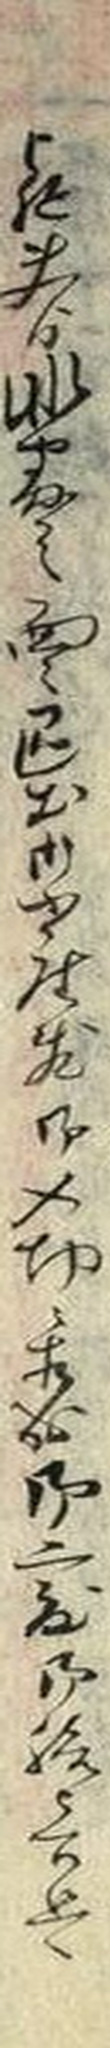被遊夫ゟ非番之面々退出御小座敷御〆切ニ相成御二度御膳被召上候
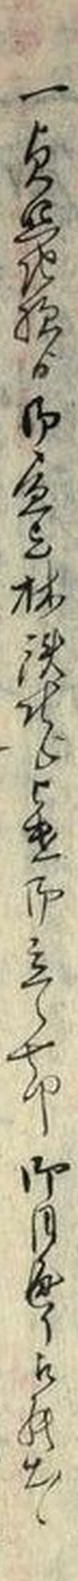一貞照院様ゟ御昼迄林鉄次郎被遣御立之節御目通り江罷出候
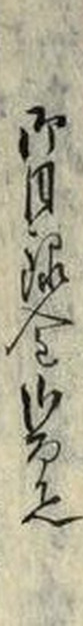御肴料金弐百疋
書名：少傅日録抄（斉承付側向頭取日記、在国）
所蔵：福井県文書館 Fukui Prefectural Archives
